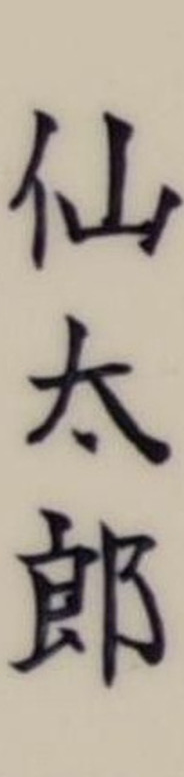仙太郎
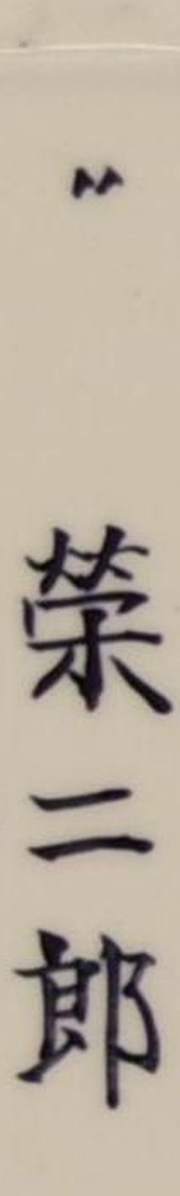榮二郎
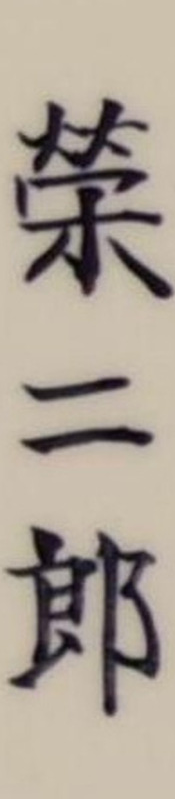榮二郎

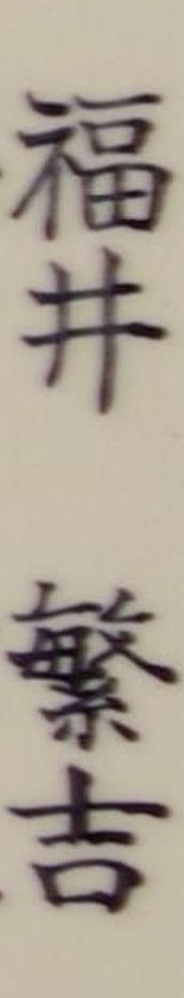福井繁吉
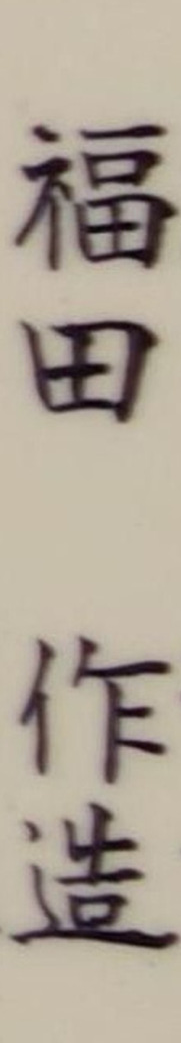福田作造
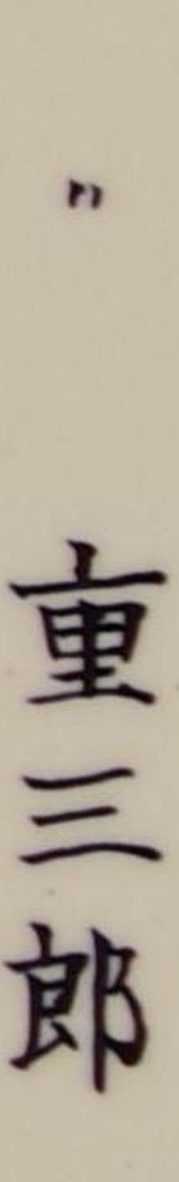重三郎
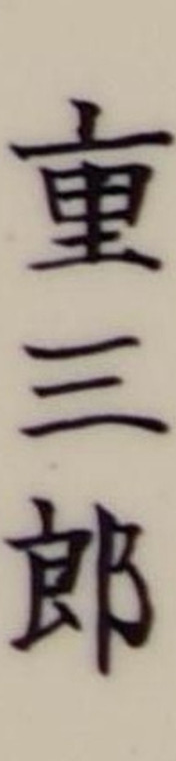重三郎
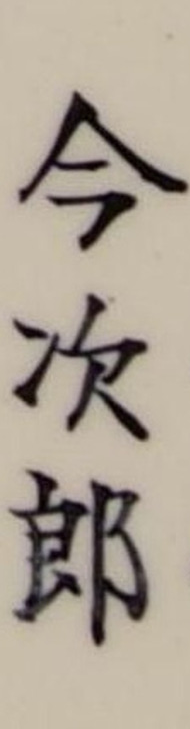今次郎
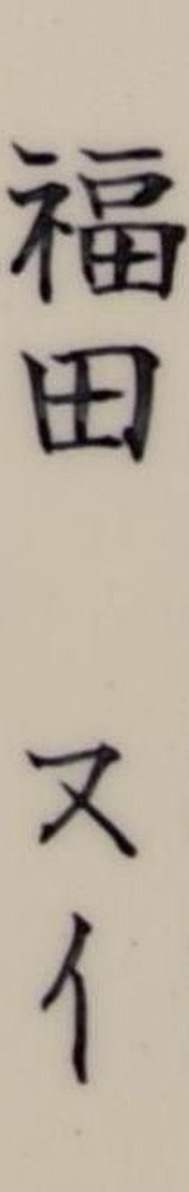福田スイ
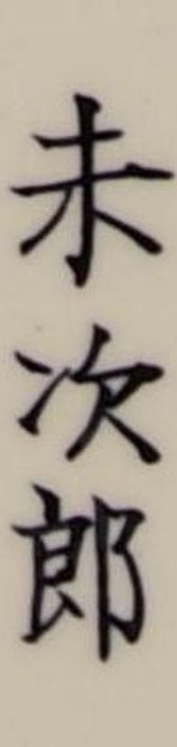今次郎
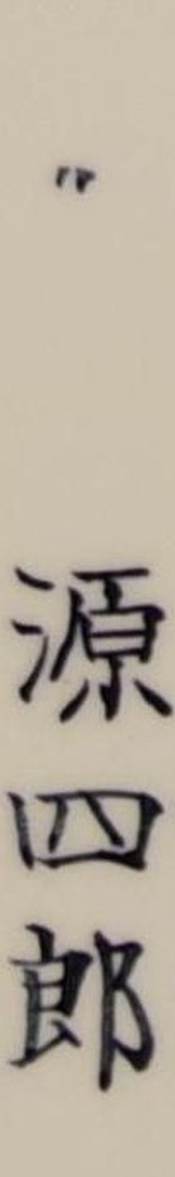源四郎
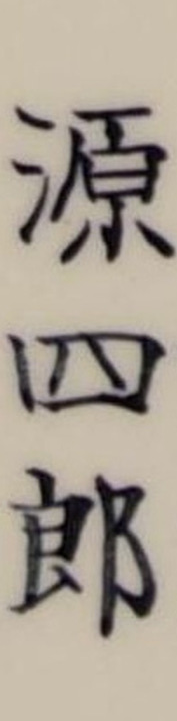源四郎
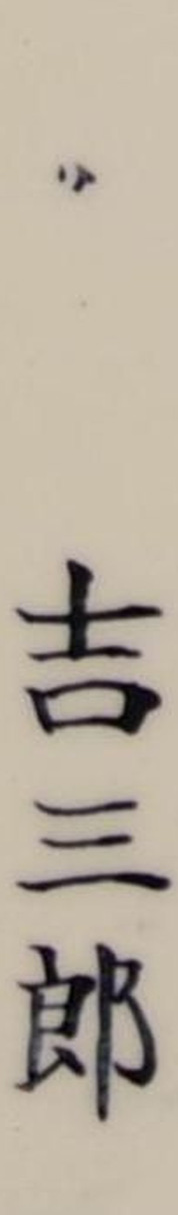吉三郎
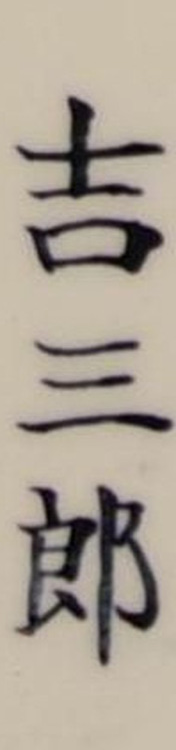吉三郎
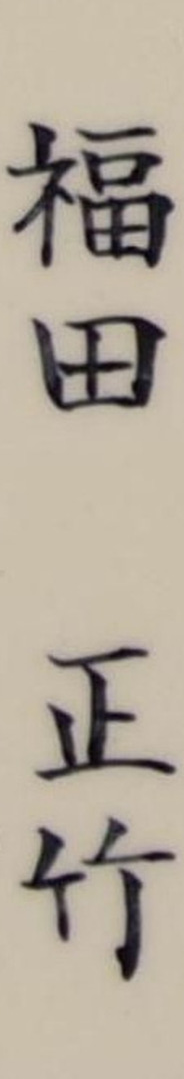福田正竹
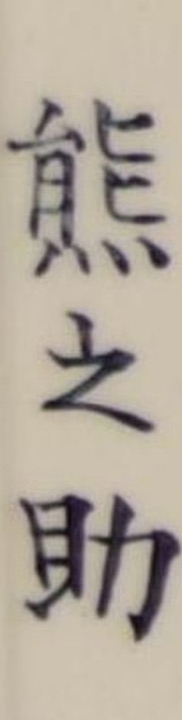熊之助
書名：E~L
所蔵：高野山金剛峯寺
